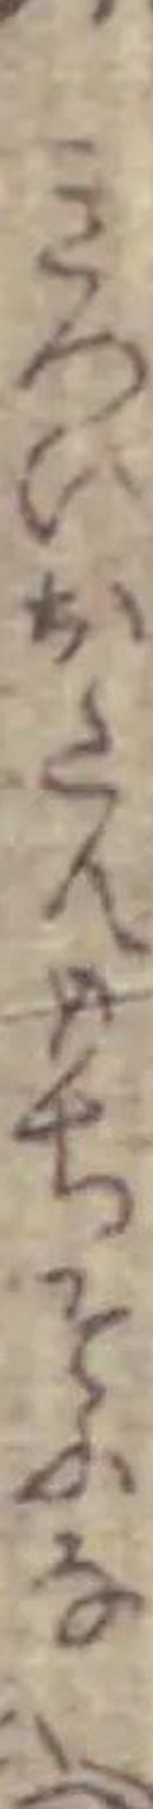きついおたんもちそふな
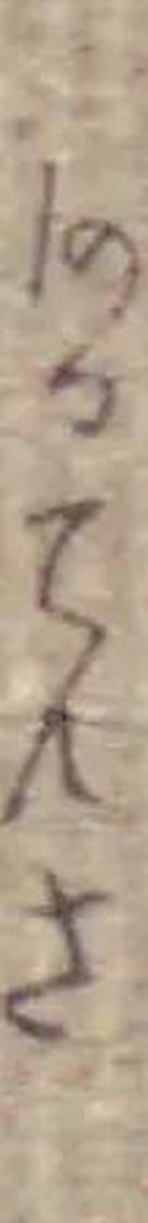あかてんさ
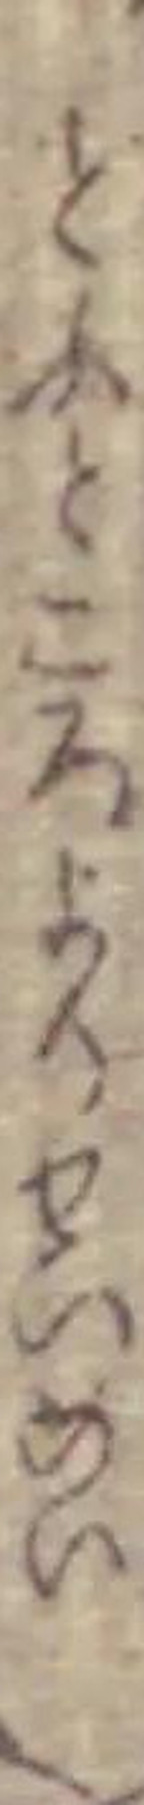とふところよりせいめい
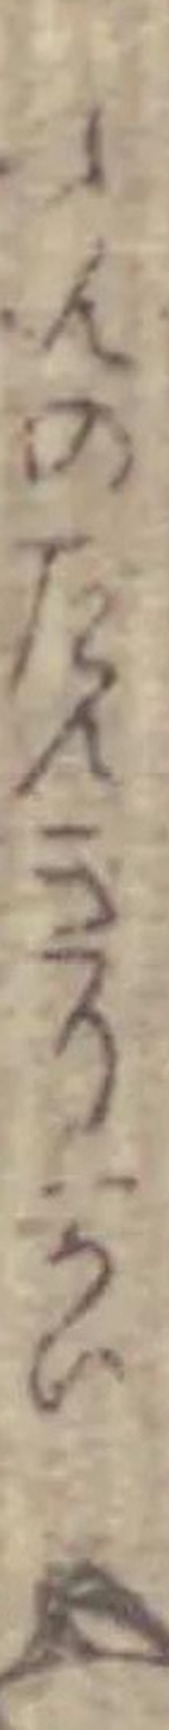たんのたんきり一かい
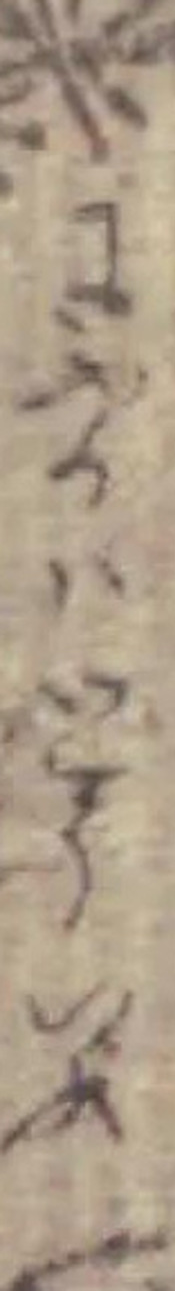にやるはとういふ
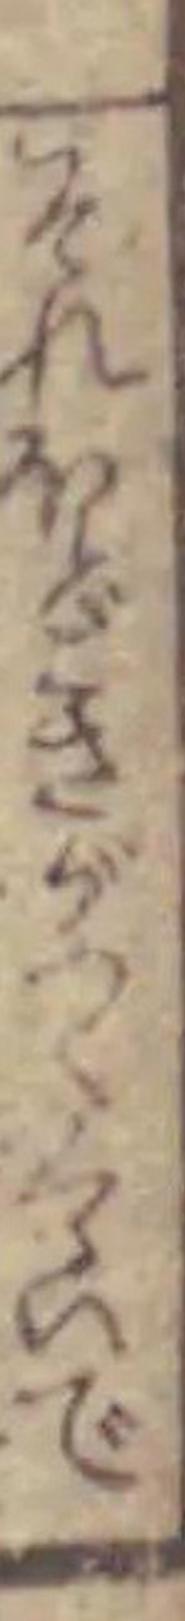それほどきがつくくらいで
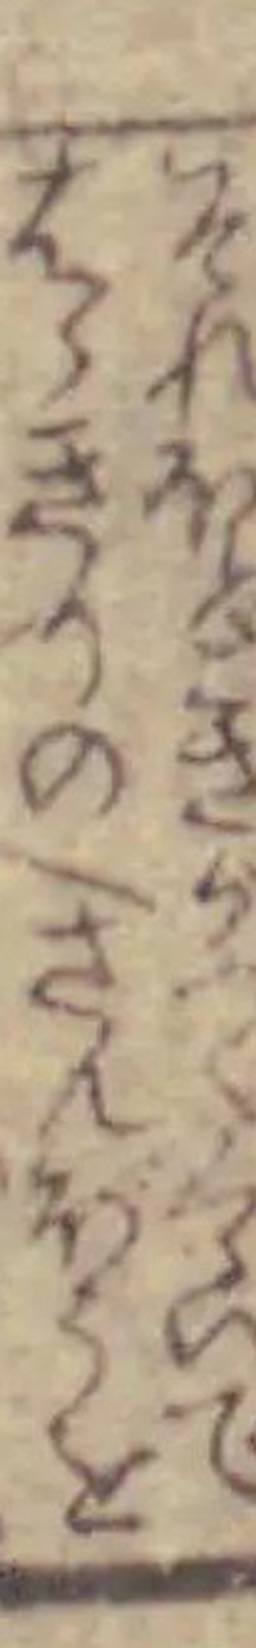はらきりのさんぼうを
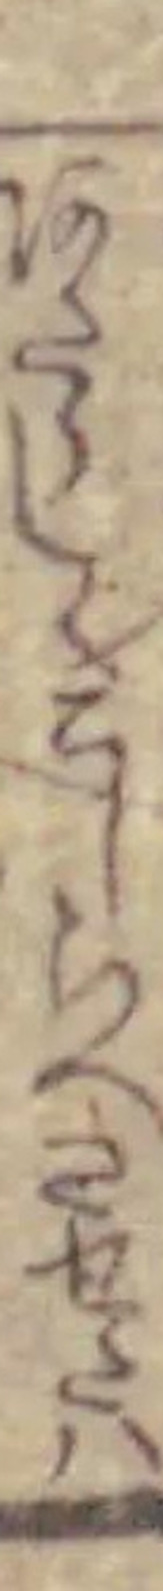あたらしくこしらへさせたは
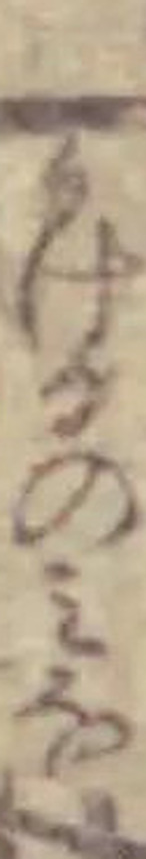かけるのみな
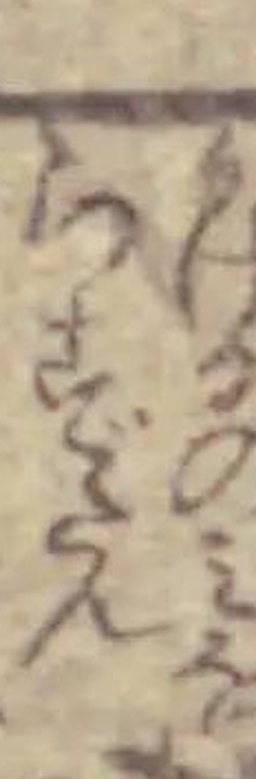らずたん
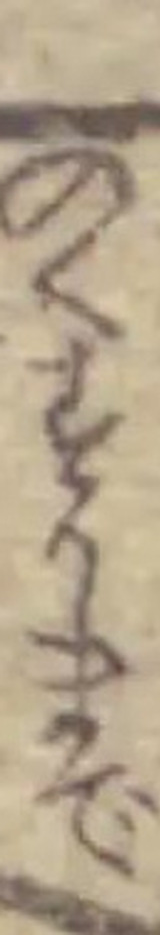のくすりまで
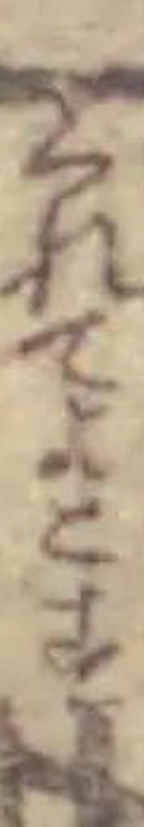くれてよこす
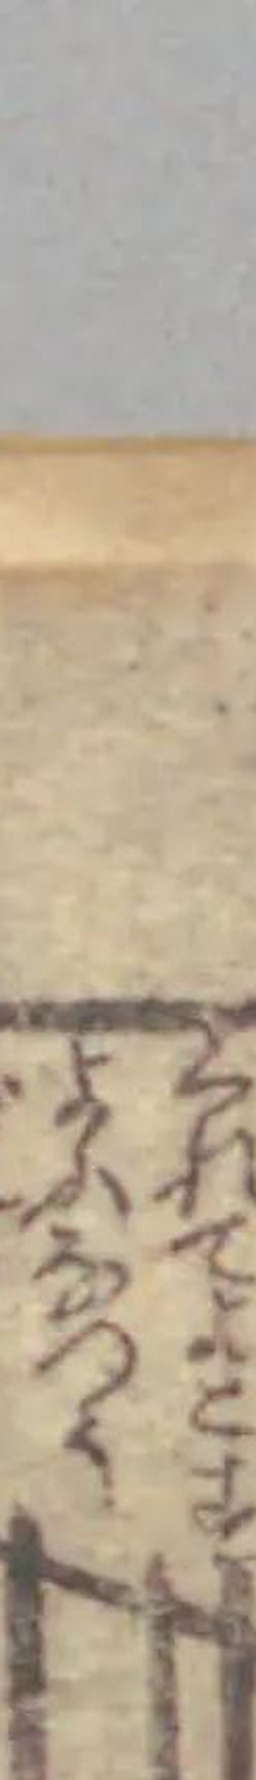よふなつう
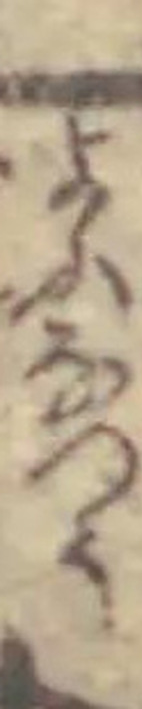よふなつう
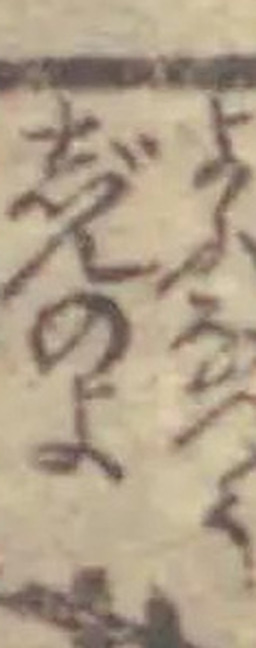じんのよ
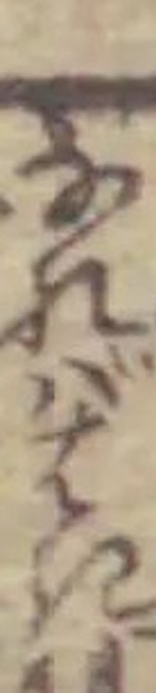なればはき
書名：茶羅毛通人 3巻
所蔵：国立国会図書館 National Diet Library, JAPAN
